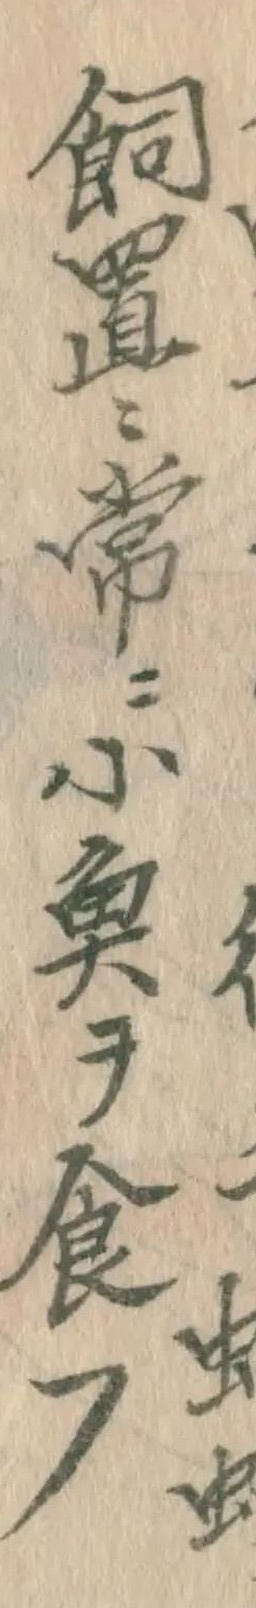飼置ニ常ニ小魚ヲ食フ

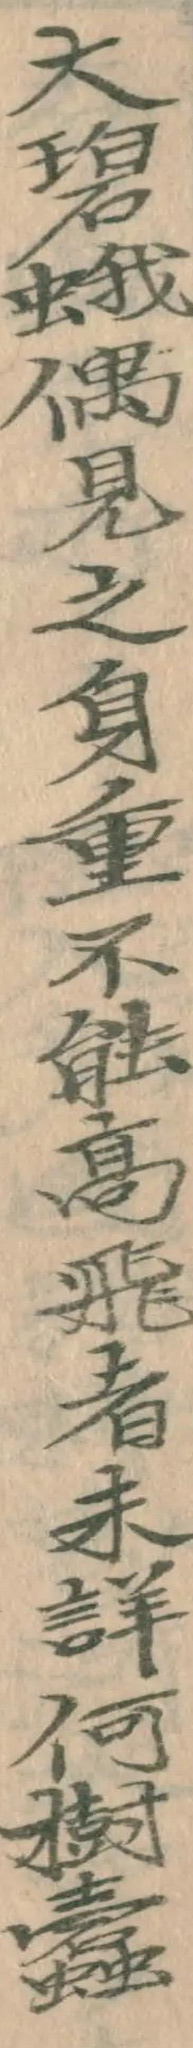大碧蛾偶見之身重不能高飛者未詳何樹蠹
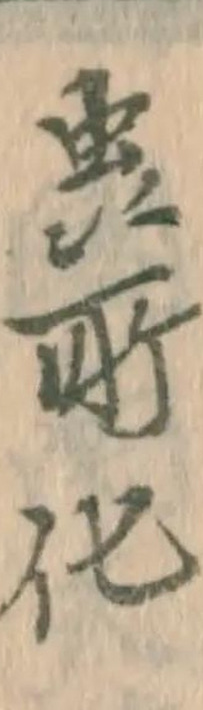蟲所化
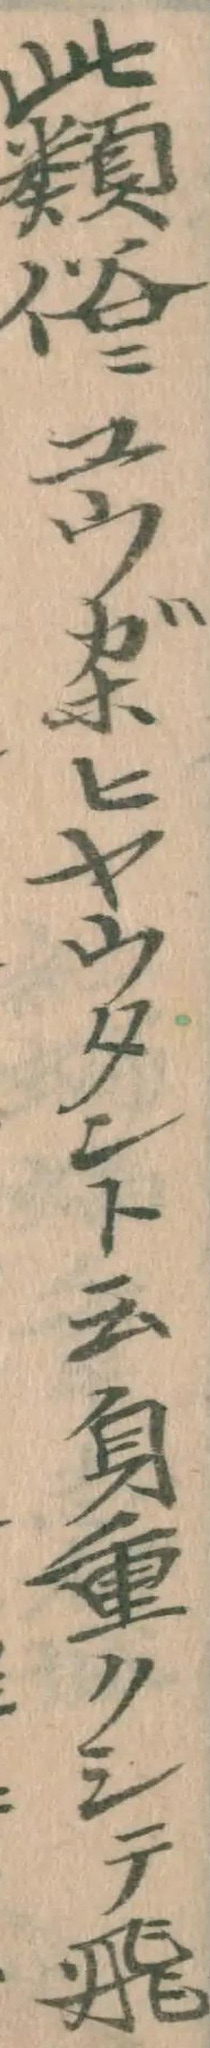此類俗ニユウガホヒヤウタント云身重クシテ飛
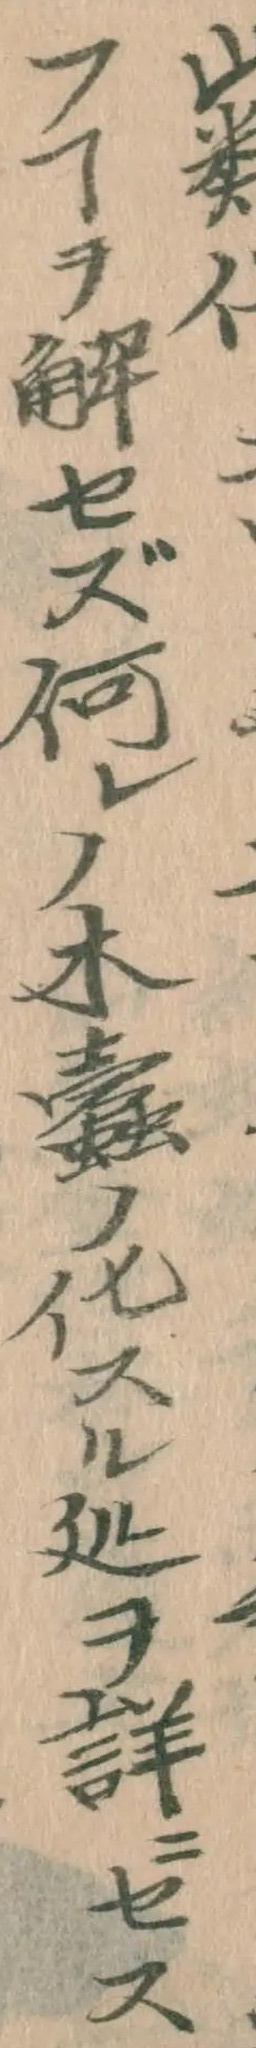フコトヲ解セズ何レノ木蠹ノ化スル処ヲ詳ニセス
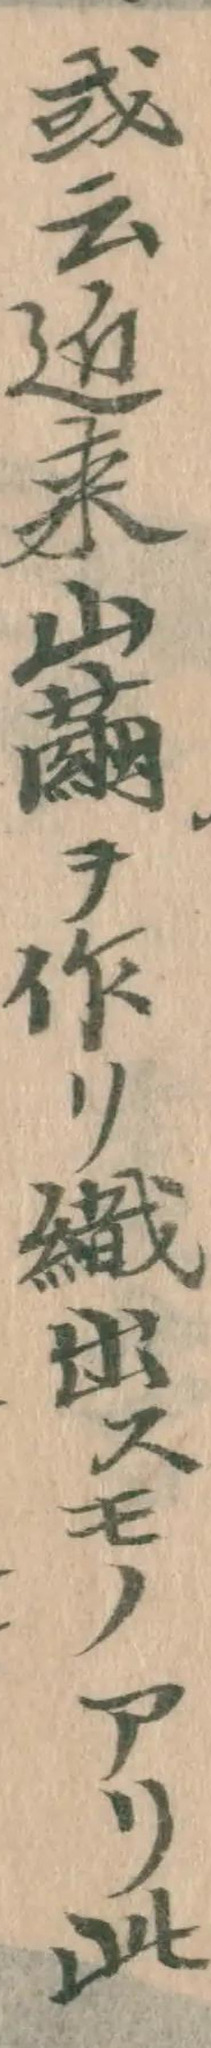或云近来山繭ヲ作リ織出スモノアリ此
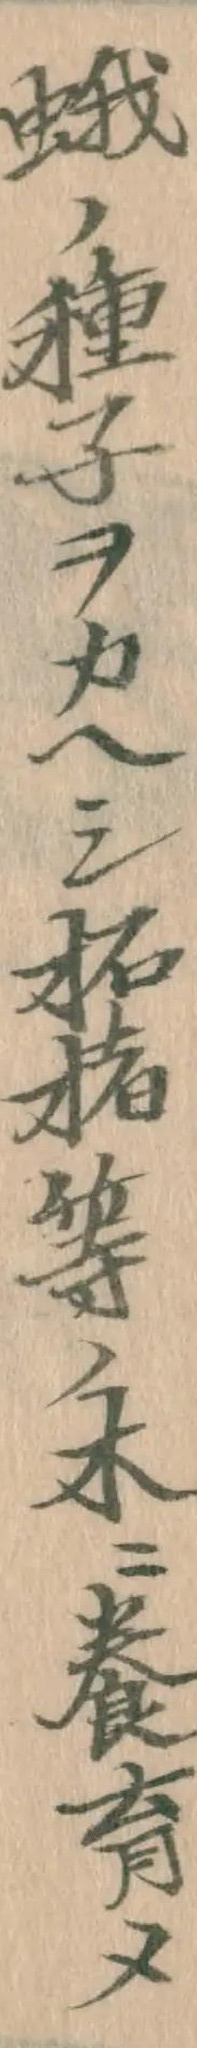蛾ノ種子ヲカヘシ柘楮等ノ木ニ養育シテ
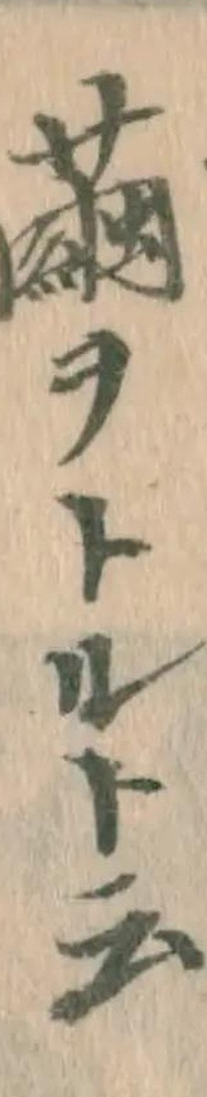繭ヲトルト云

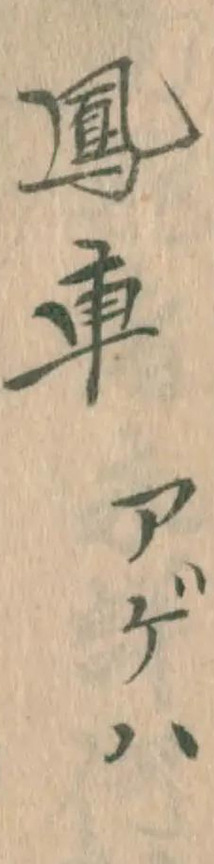鳳車アゲハ
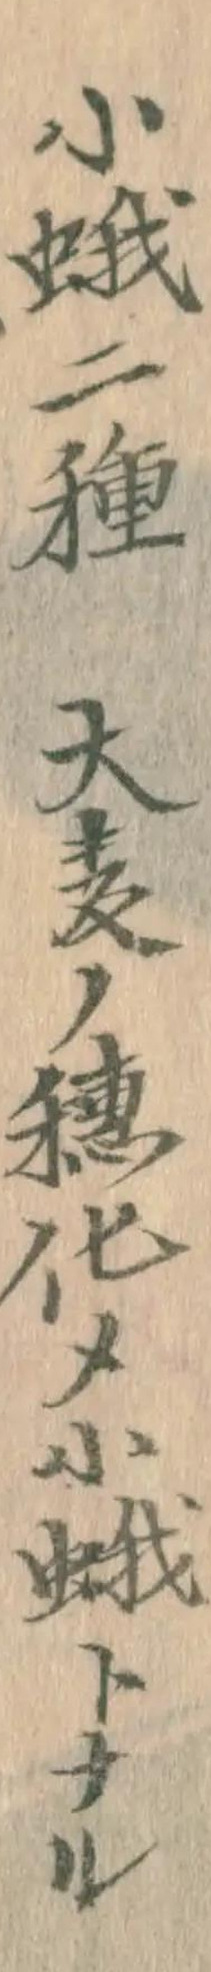小蛾二種大麦ノ穂化シテ小蛾トナル
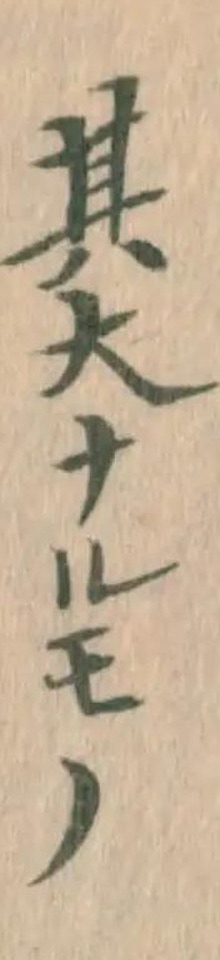其大ナルモノ
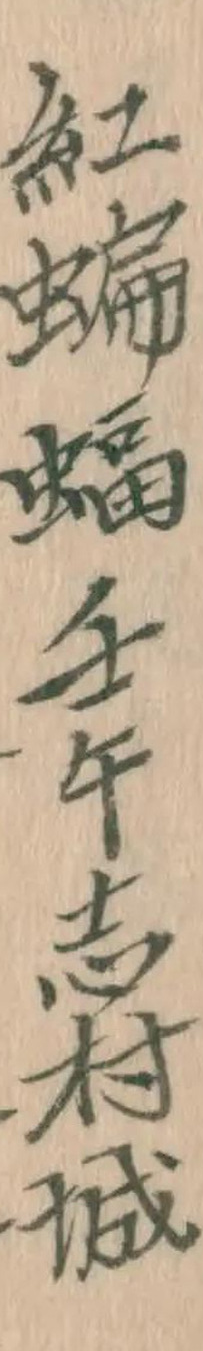紅蝙蝠壬午志村城
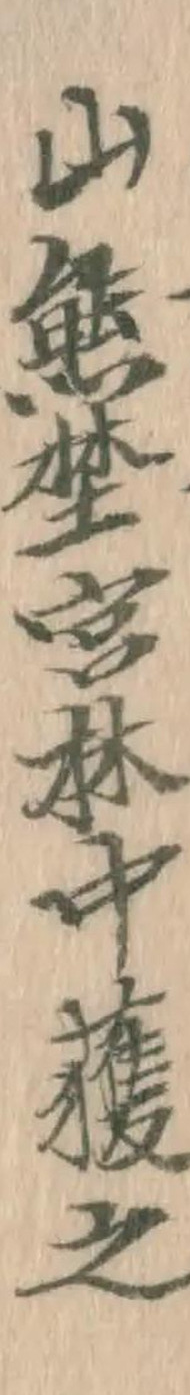山熊埜宮林中獲之
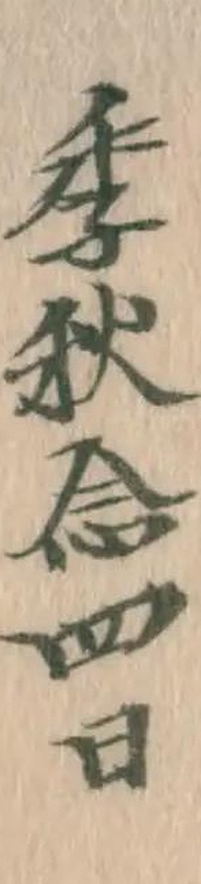季秋念四日

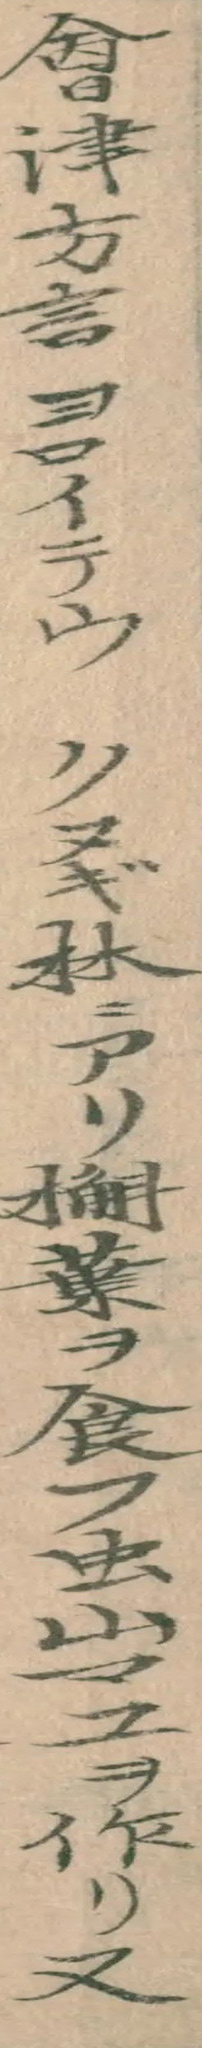會津方言ヨロイテウクヌギ林ニアリ槲葉ヲ食フ虫山マユヲ作リ又
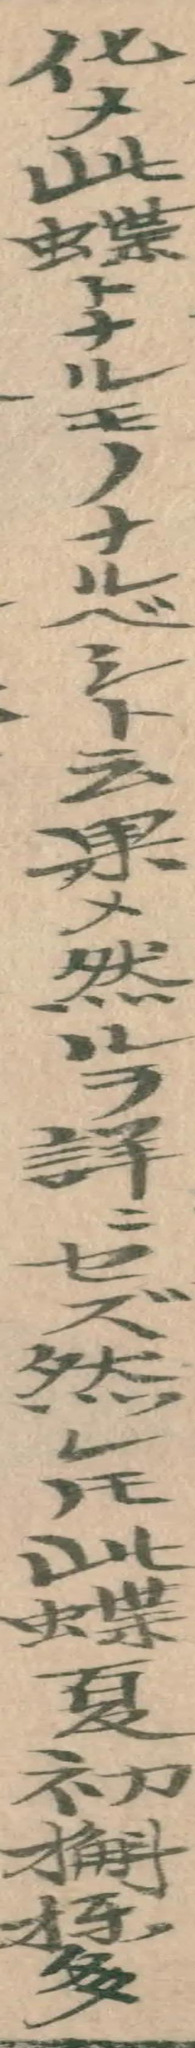化シテ此蝶トナルモノナルベシト云果シテ然ルヲ詳ニセズ然レトモ此蝶夏初槲櫟多
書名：千蟲譜 3巻. [1]
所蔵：国立国会図書館 National Diet Library, JAPAN
